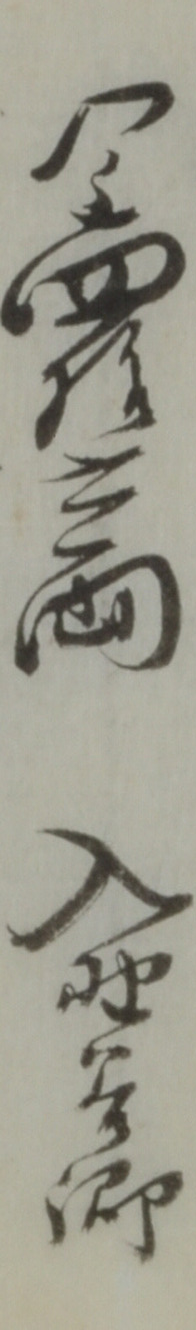金四拾六両入野谷郷
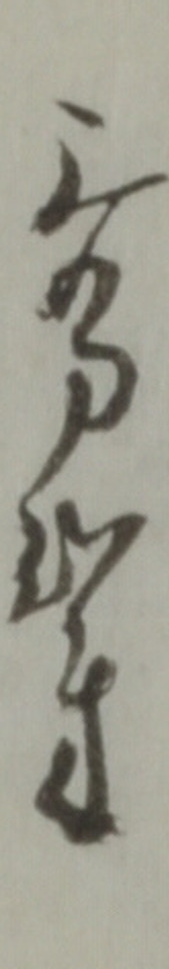三分弐朱
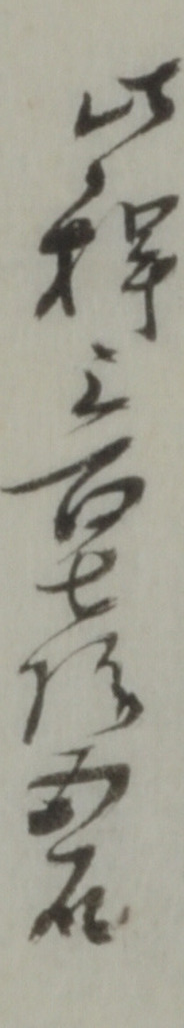此稈三百七拾五石
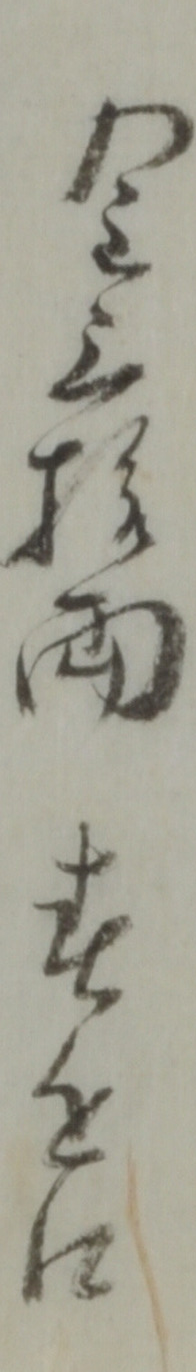金三拾両春近郷
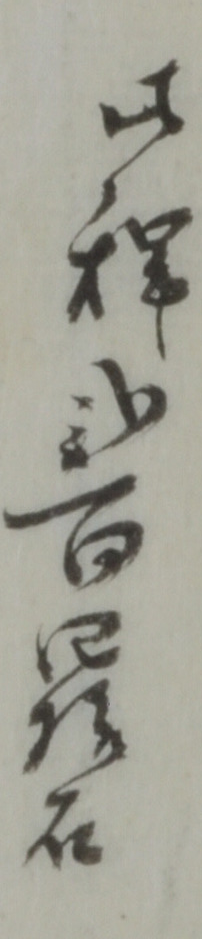此稈弐百四拾石
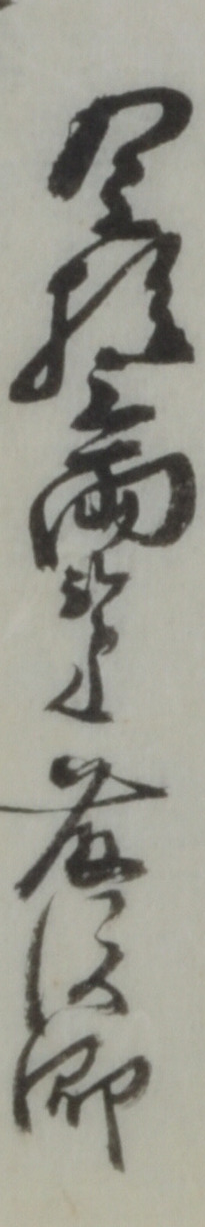金拾三両弐朱藤沢郷
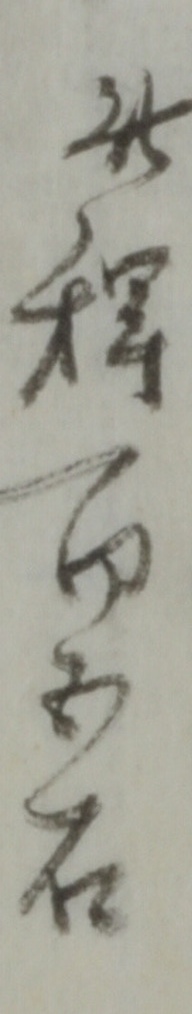此稈百五石

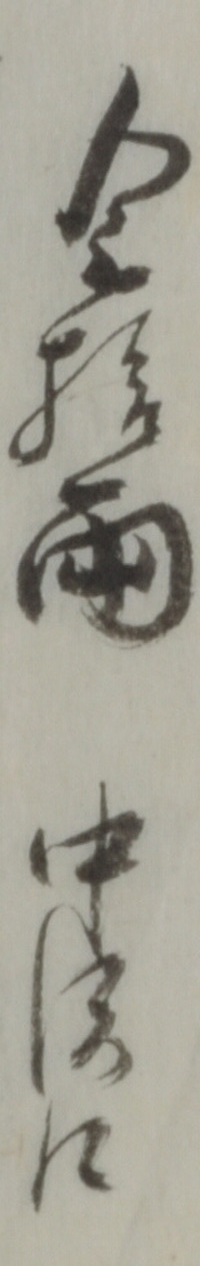金拾両中沢郷
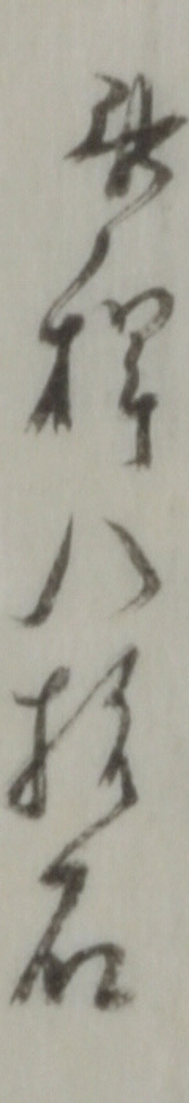此稈八拾石
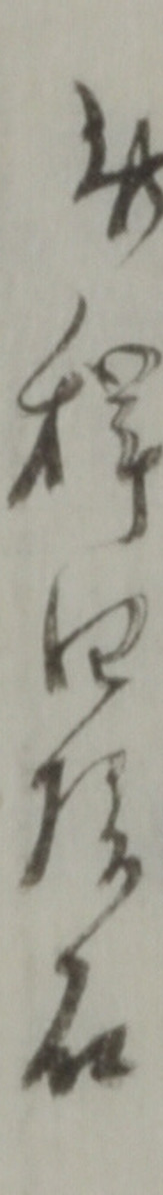此稈四拾石
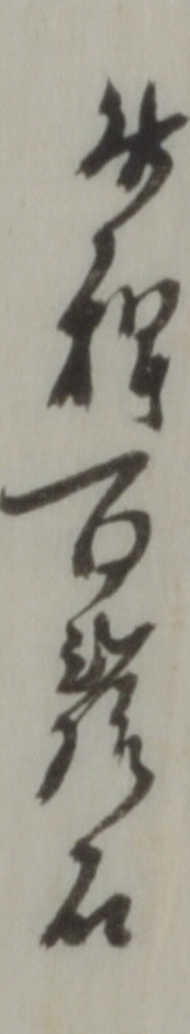此稈百弐拾石
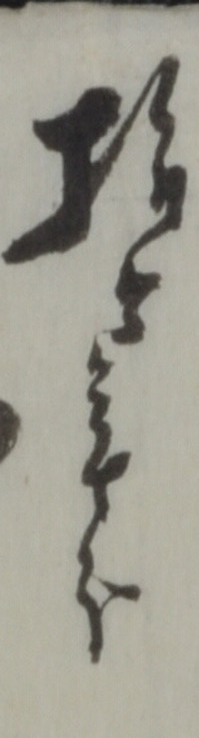拾ヶ年分
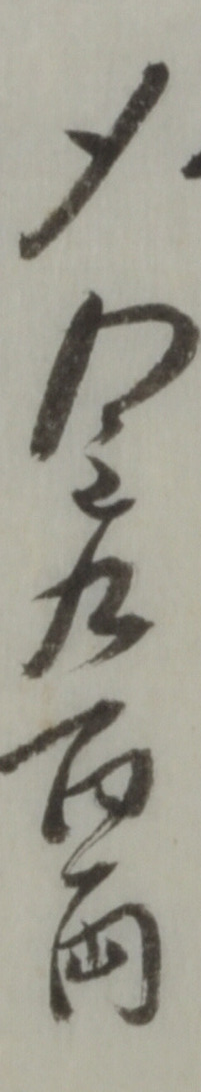〆金九百両
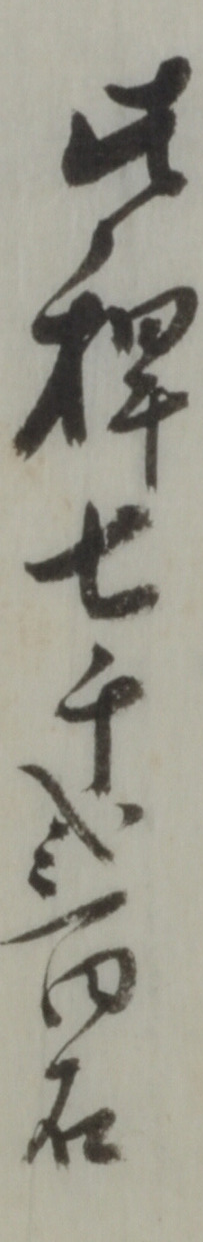此稈七千弐百石
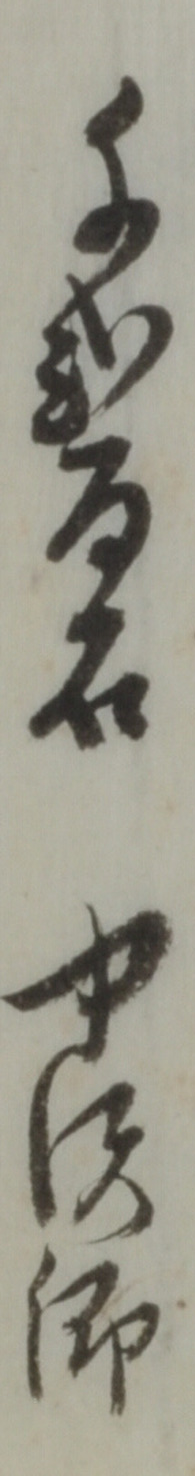千弐百石中沢郷
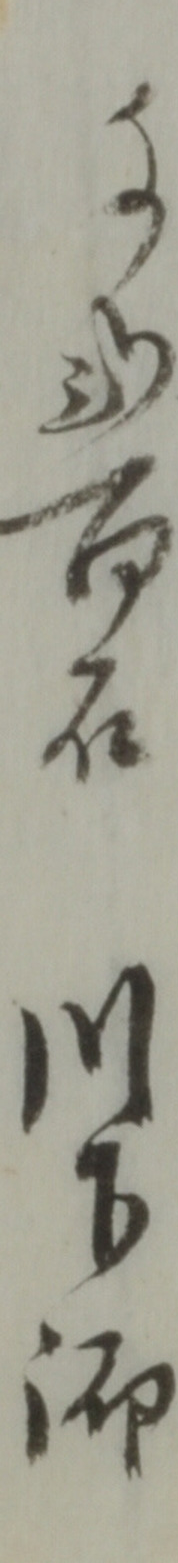千弐百石川下郷
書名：在町雑穀御買入大図
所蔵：伊那市立高遠町図書館・合同会社AMANE
